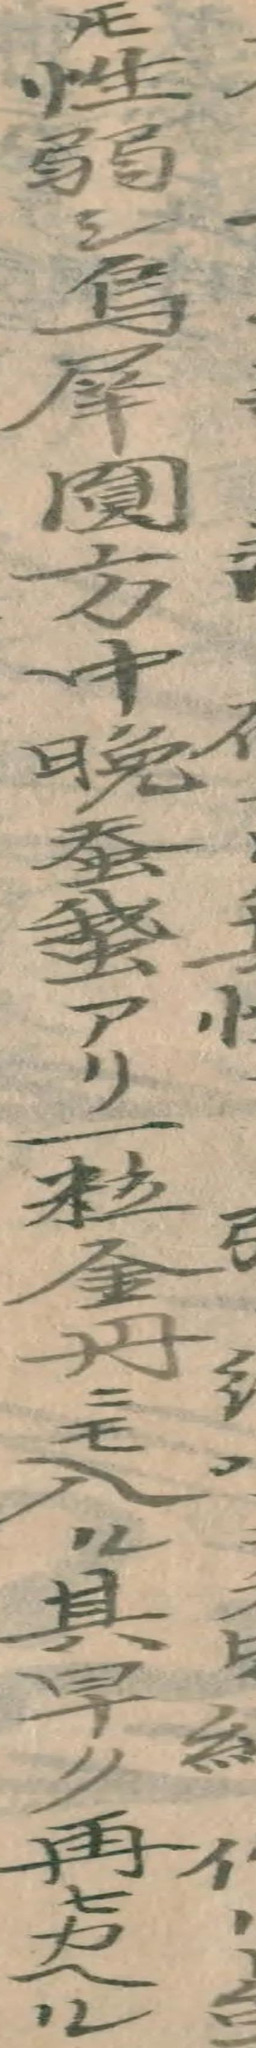トモ性弱シ烏𡱝圓方中晩蚕䖸アリ一粒金丹ニモ入ル其早ク再ヒカヘル
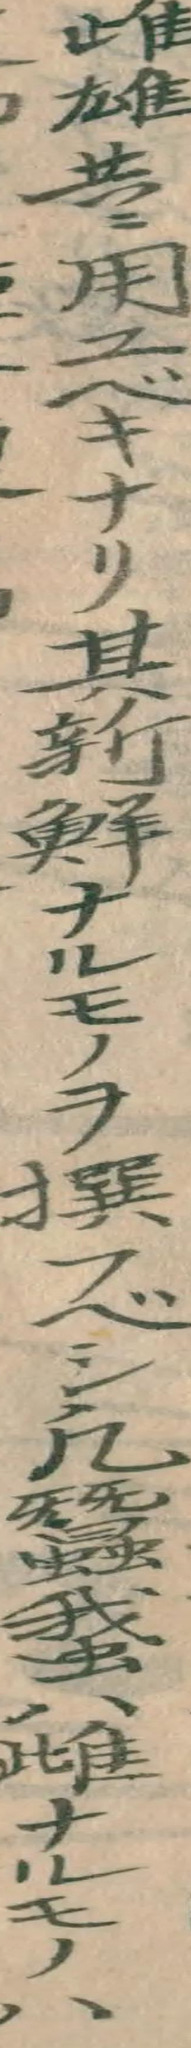雌雄共ニ用ユベキナリ其新鮮ナルモノヲ撰フベシ凡蠶䖸ハ雌ナルモノハ
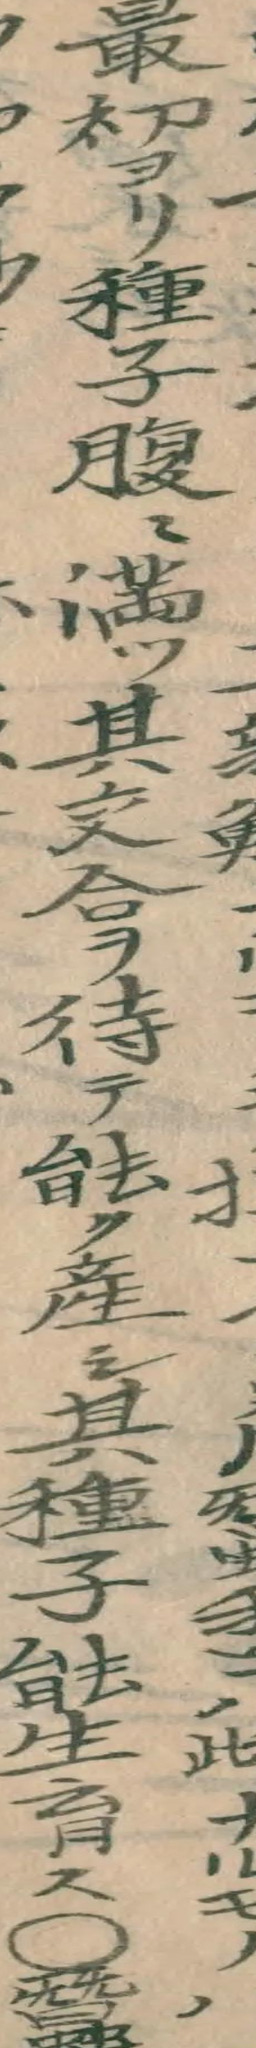最初ヨリ種子腹ニ滿ツ其交合ヲ待テ能ク産シ其種子能生育ス○蠶
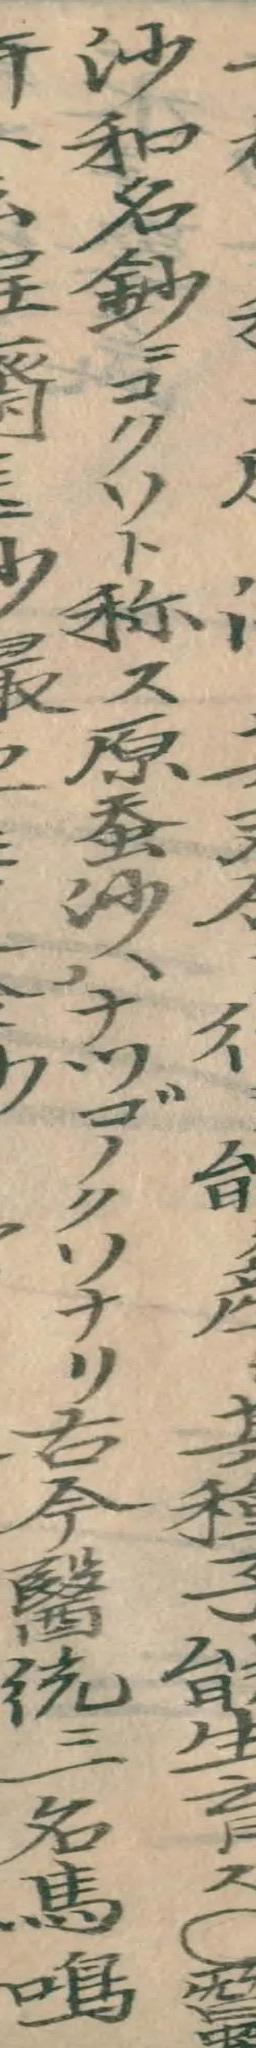沙和名鈔ニコクソト称ス原蚕沙ハナツゴノクソナリ古今醫統ニ一名馬鳴
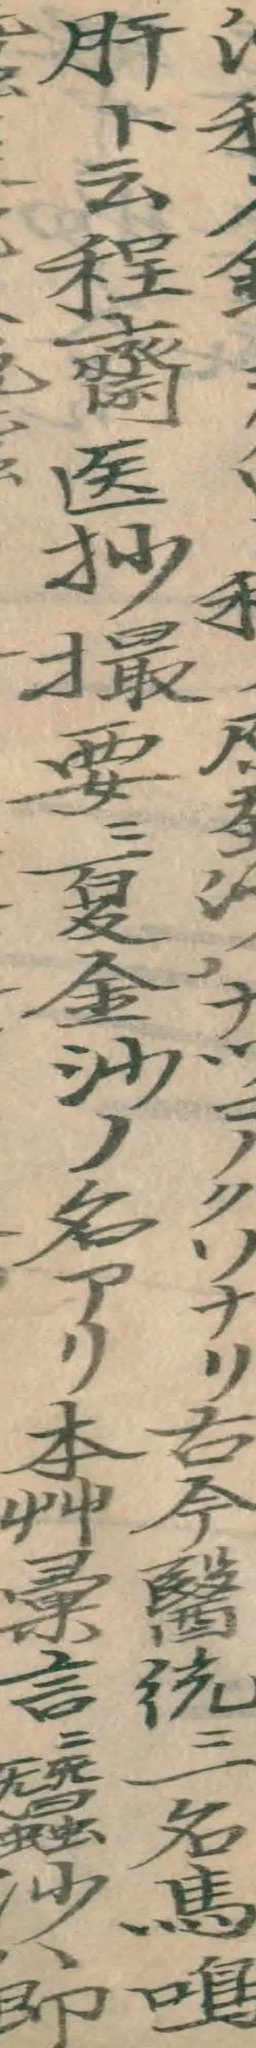肝ト云程齊医抄撮要ニ夏金沙ノ名アリ本艸彙言ニ蠶沙ハ即
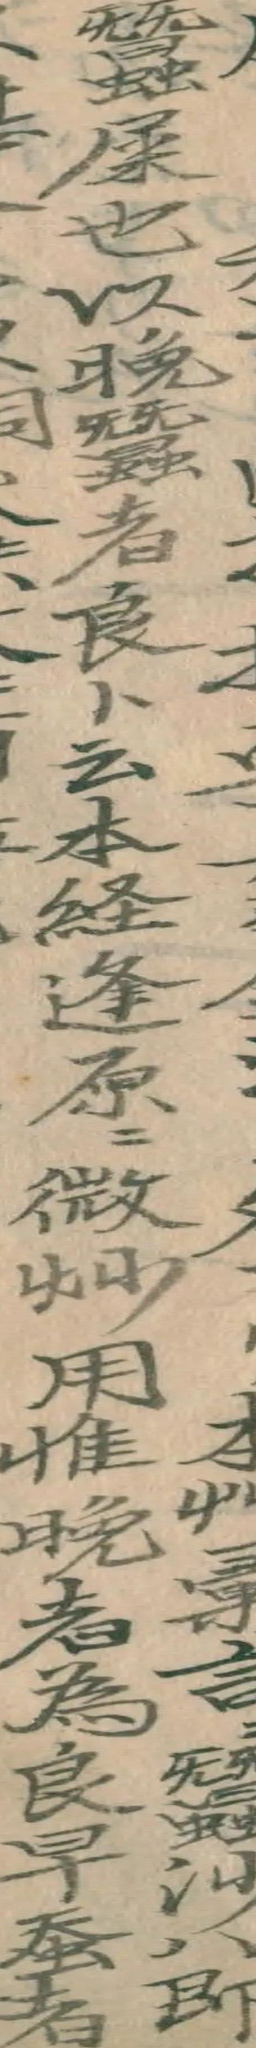蠶屎也以晩蠶者良ト云本経逢原ニ微炒用惟晩者為良早蚕者
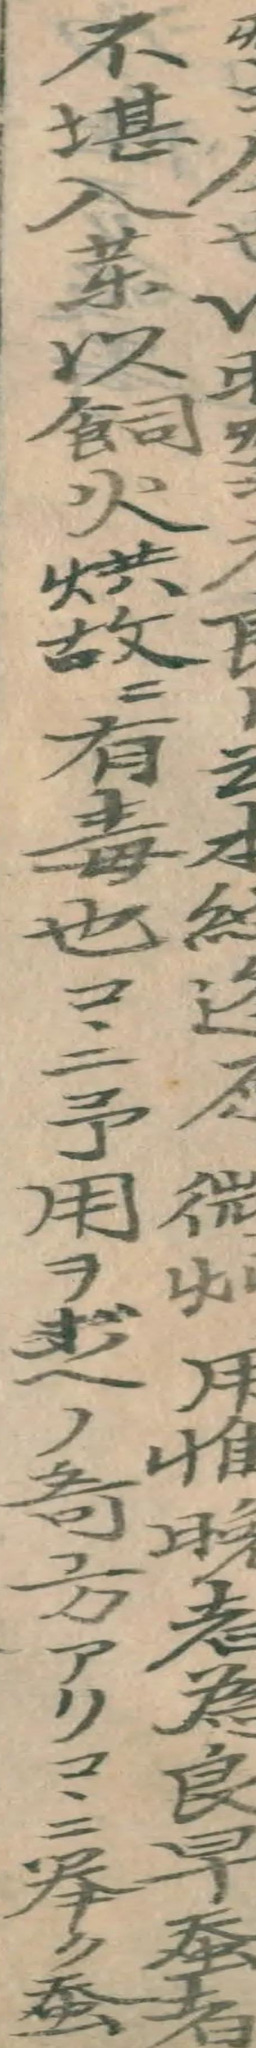不堪入薬以飼火烘故ニ有毒也コヽニ予用ヲボヘノ奇方アリコヽニ挙ク蚕

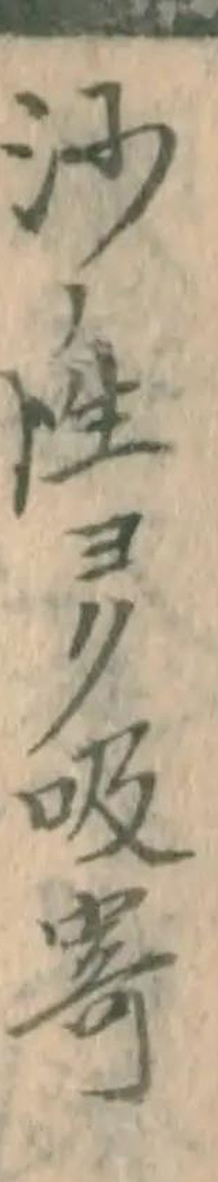沙ノ性ヨク吸寄
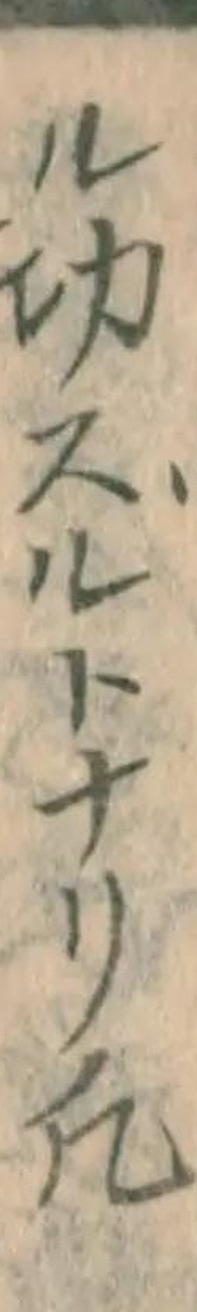ル功スルトナリ凡
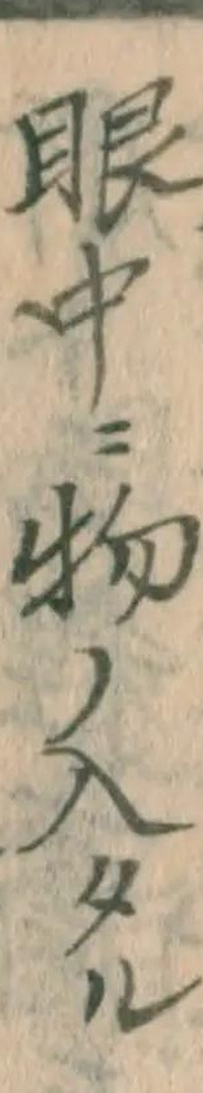眼中ニ物ノ入タル
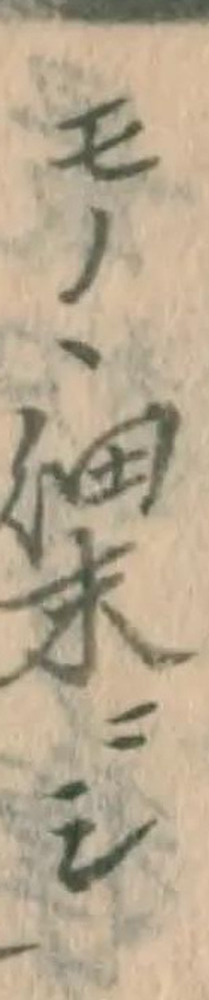モノヽ細末ニシ
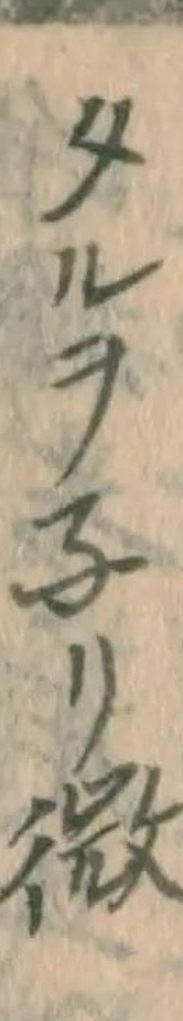タルヲネリ微
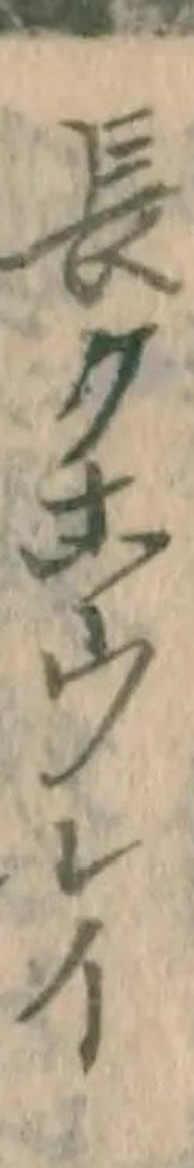長クホウレイ
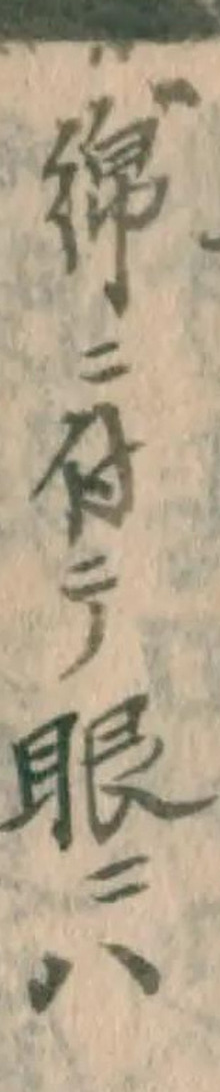綿ニ付テ眼ニハ
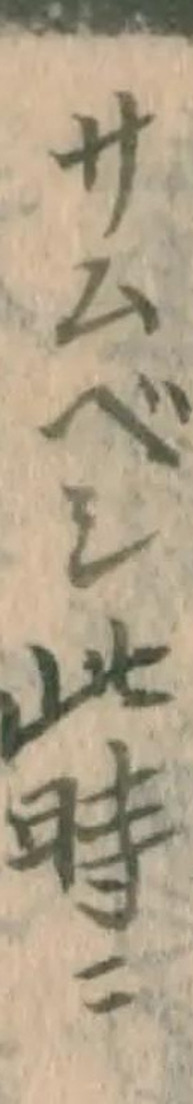サムベシ此時ニ
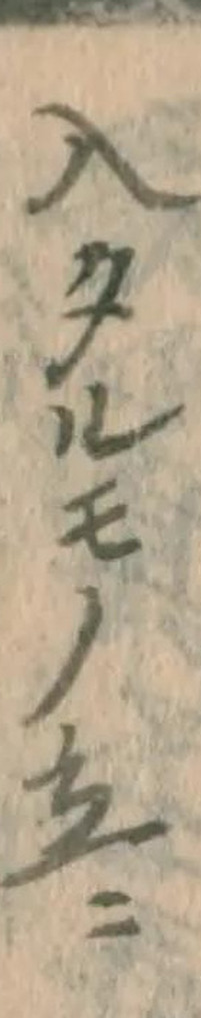入タルモノ立ニ
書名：千蟲譜 3巻. [1]
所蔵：国立国会図書館 National Diet Library, JAPAN
